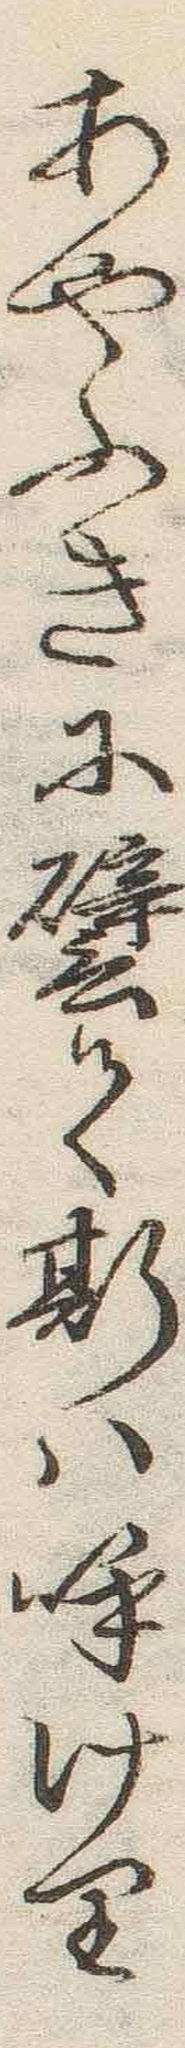あやふきに譬て斯は呼けり
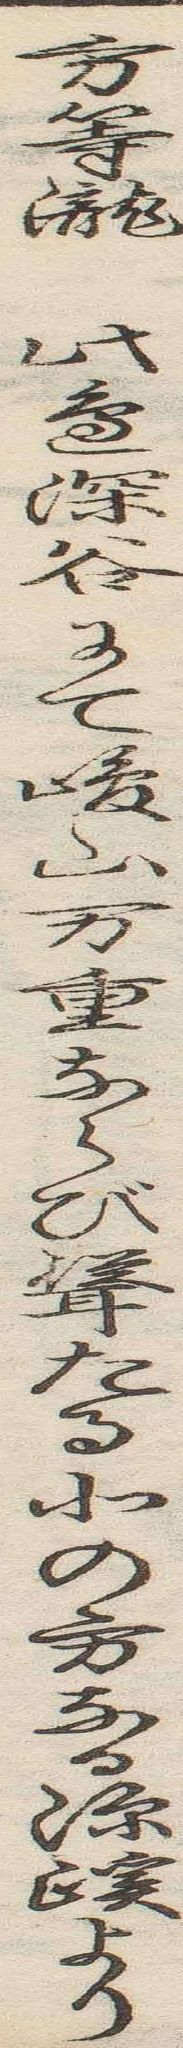方等瀧此邊深谷にて峻山万重ならび聳たる北の方なる深蹊より
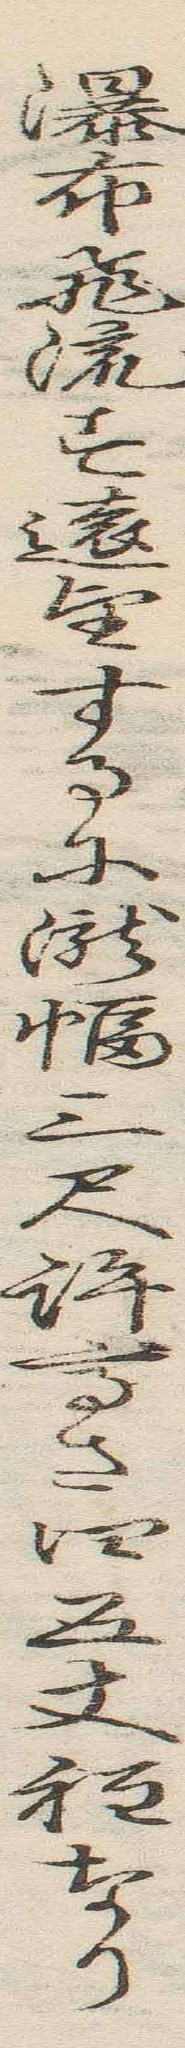瀑布飛流す遠望するに瀧幅三尺許高さ四五丈程なり
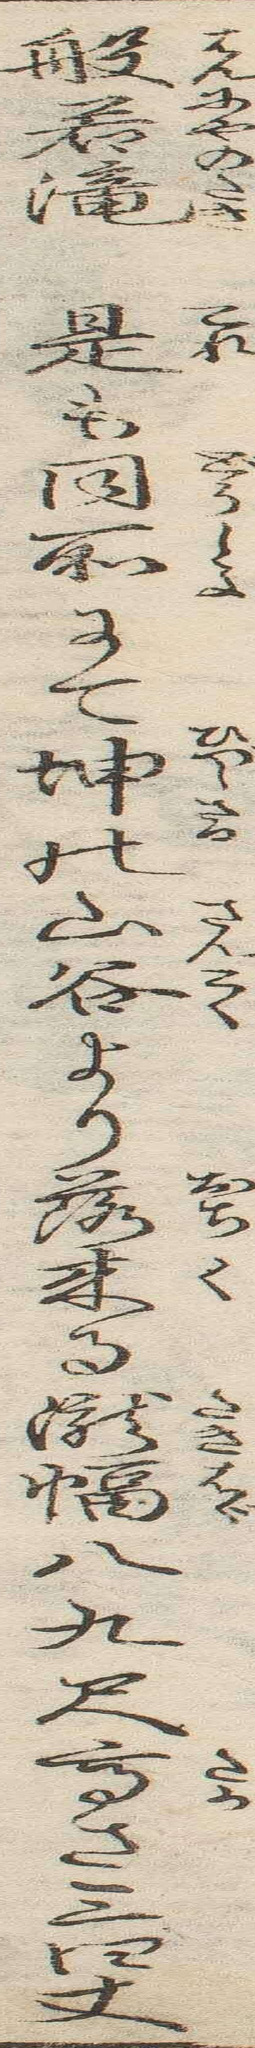般若滝是も同所にて坤の山谷より落來る瀧幅八九尺高さ三四丈
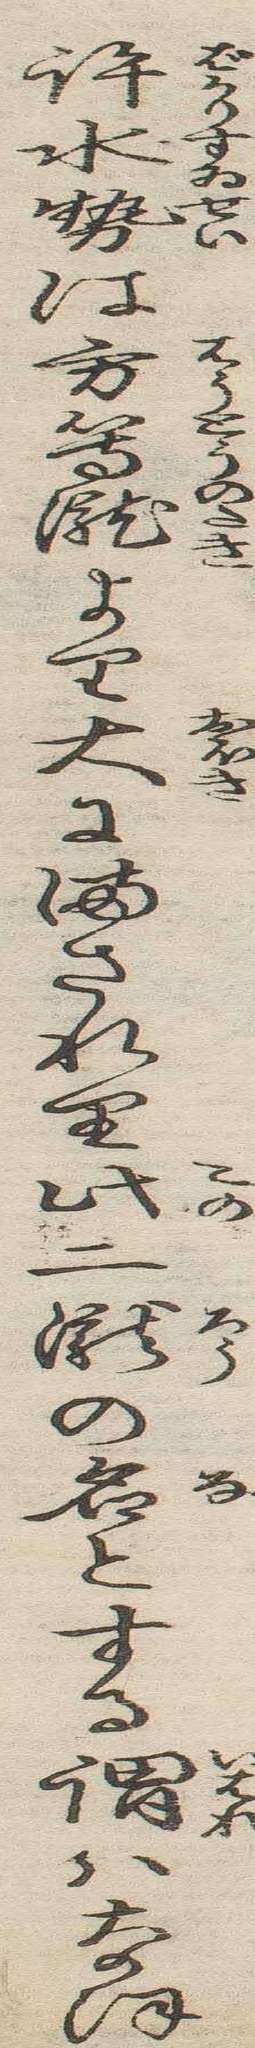許水㔟は方等瀧より大にまされり此二瀧の名とする謂はなほ
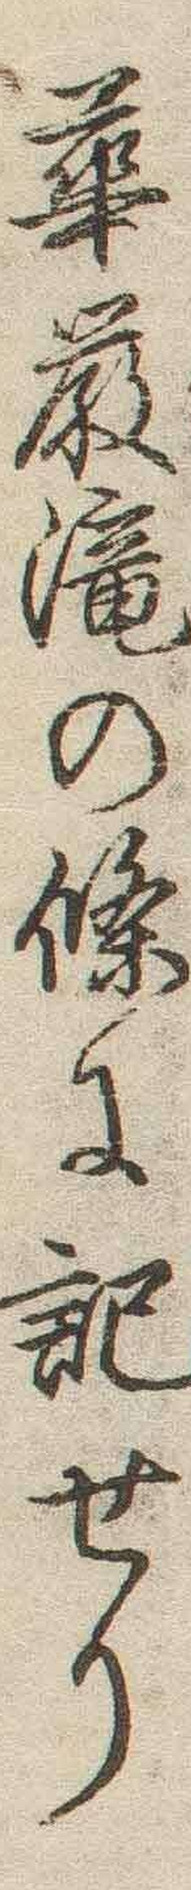蕐厳滝の條に記せり

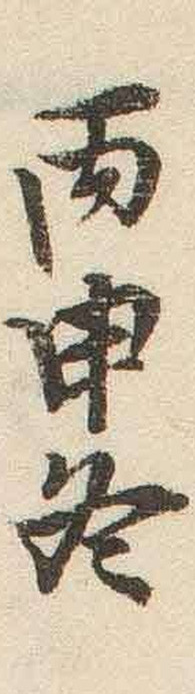丙申冬
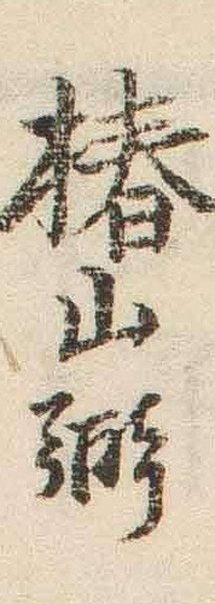椿山弼
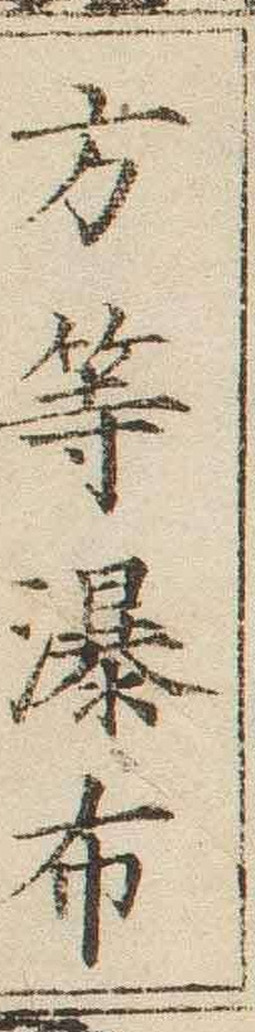方等瀑布
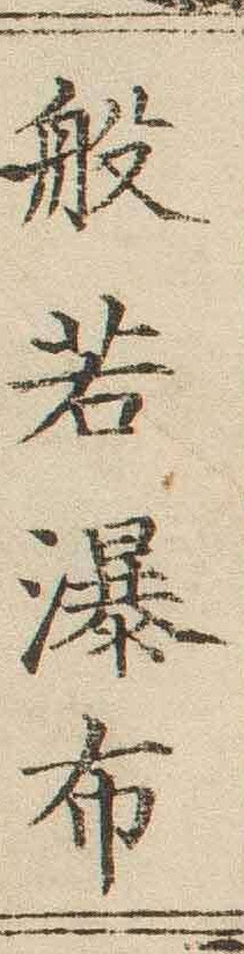般若瀑布

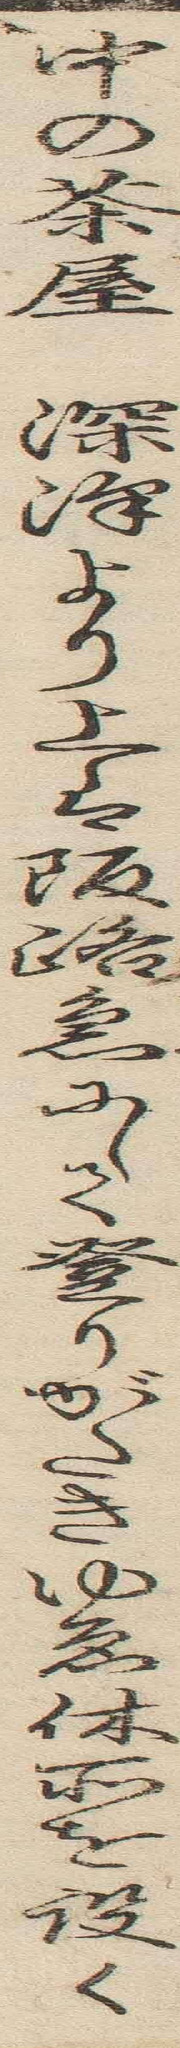中の茶屋深澤より上は阪路急にして登りがたきゆゑ休所を設く
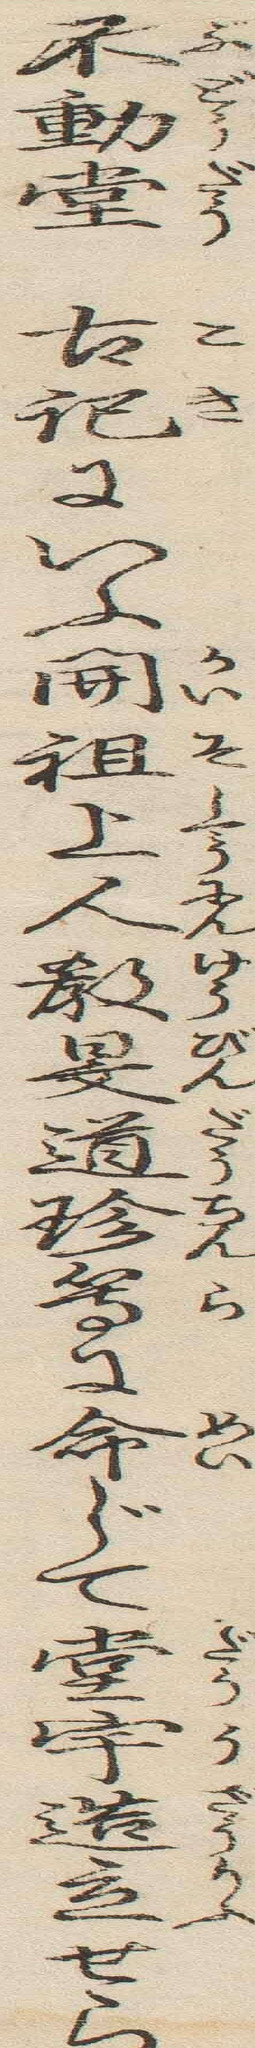不動堂古記にいふ開祖上人敎旻道珍等に命じて堂宇造立せら
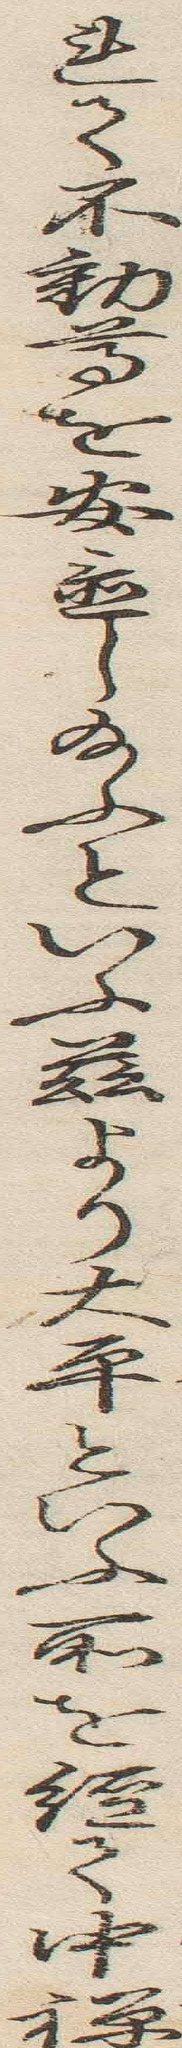れて不動尊を安置し給ふといふ兹より大平といふ所を經て中禅
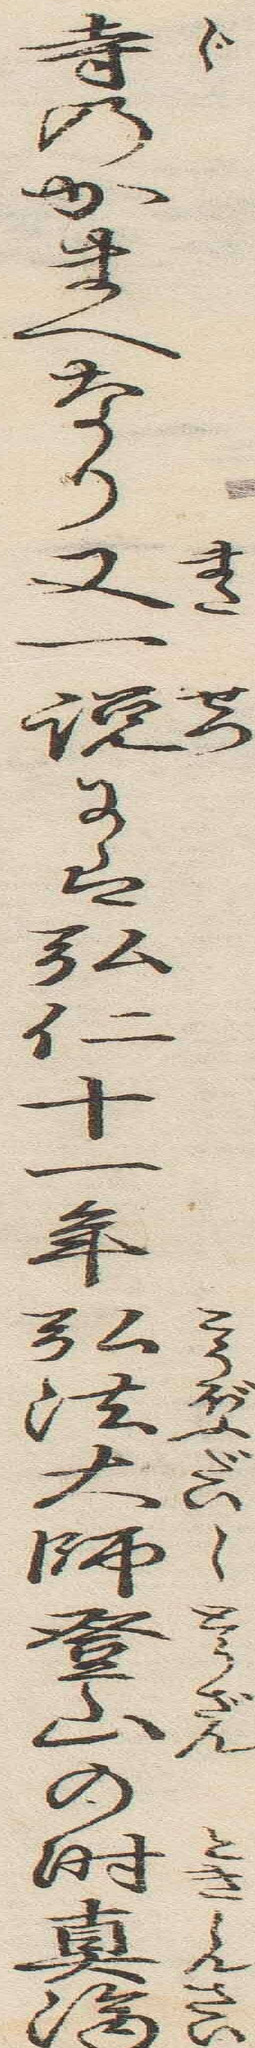寺のかまえなり又一説には弘仁十一年弘法大師登山の时真済
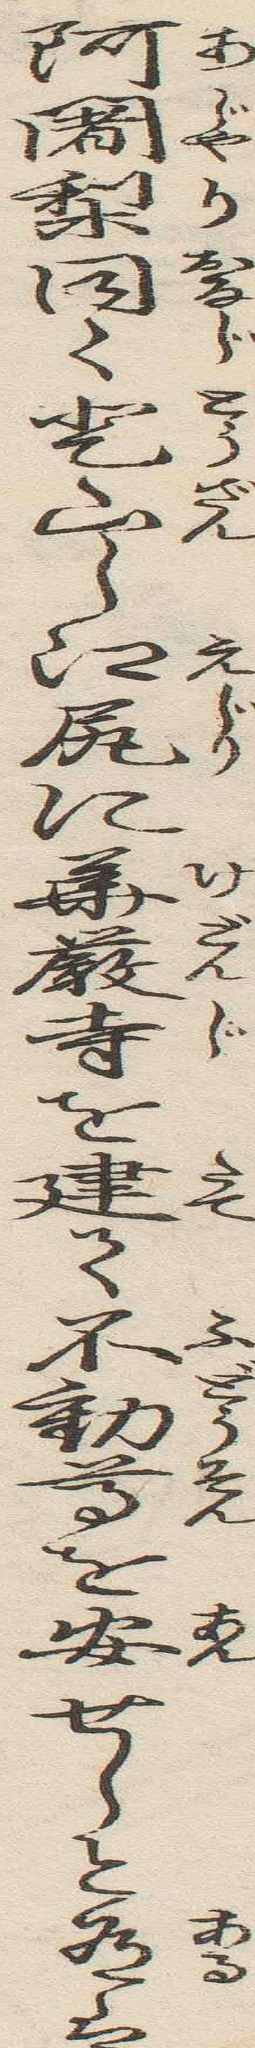阿闍梨同く登山し江尻に蕐厳寺を建て不動尊を安せしと有は
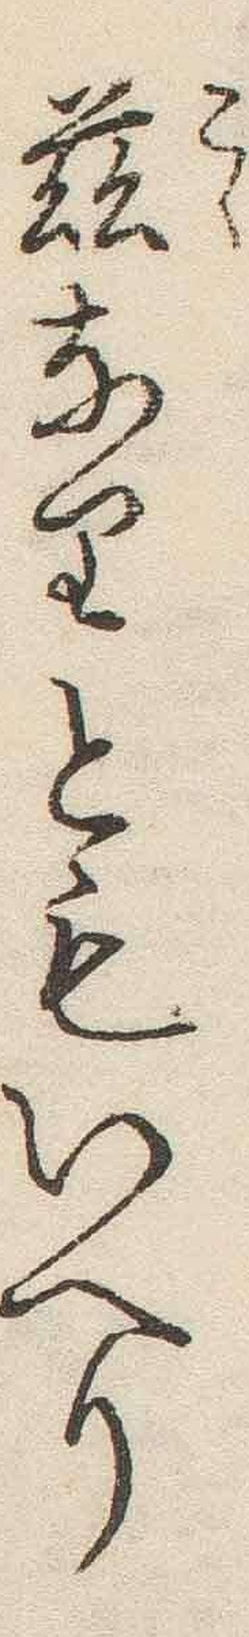兹なりともいへり
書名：日光山志
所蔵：東京学芸大学附属図書館 国文学研究資料館
